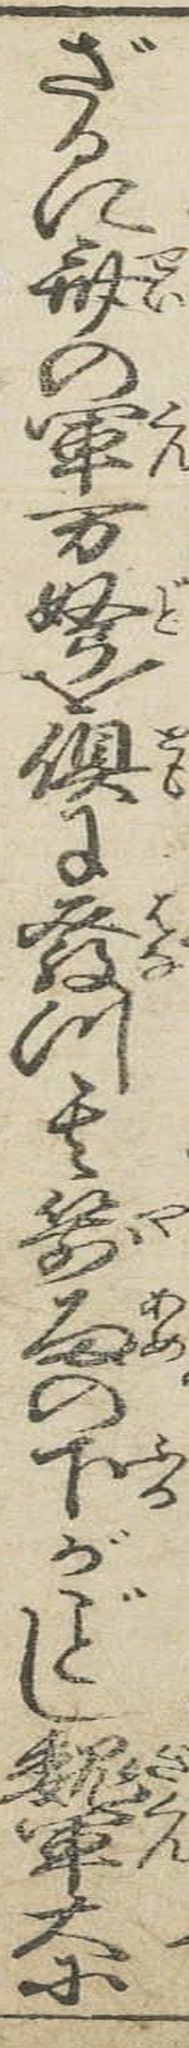ざるに斉の軍万弩を倶に発つ其箭雨の下がごとし魏軍大に
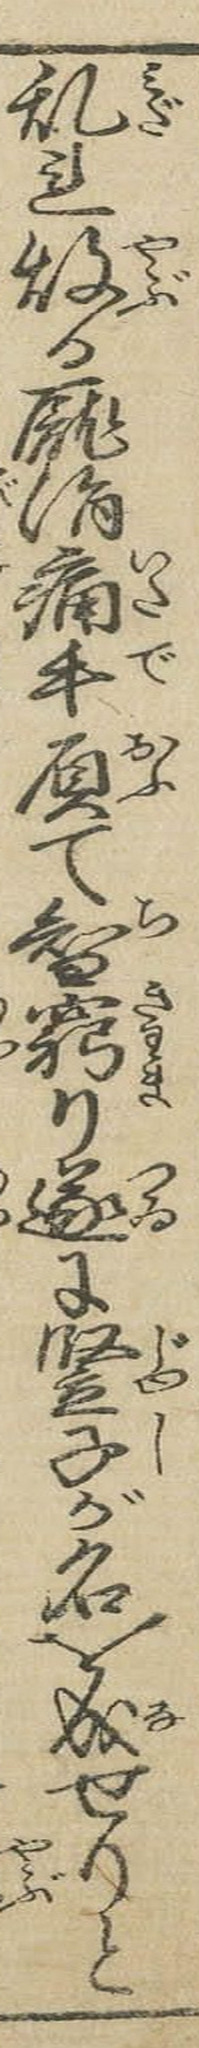乱れ敗る龐涓痛手負て智窮り遂に豎子が名を成せりと
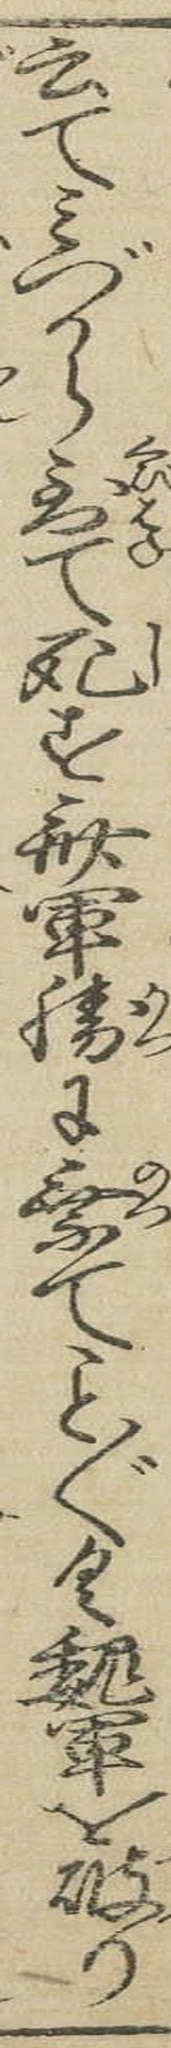云てみづから剄て死す斉軍勝に乗てこと〴〵く魏軍を破り
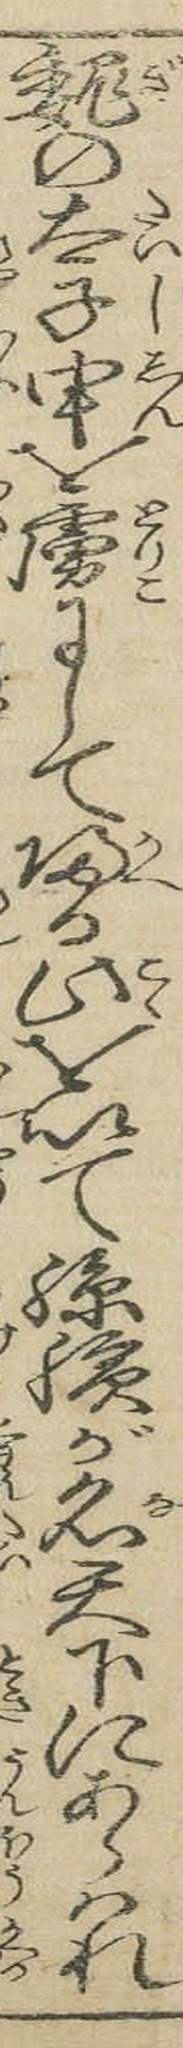魏の太子申を虜にして帰る此を以て孫臏が名天下にあらはれ
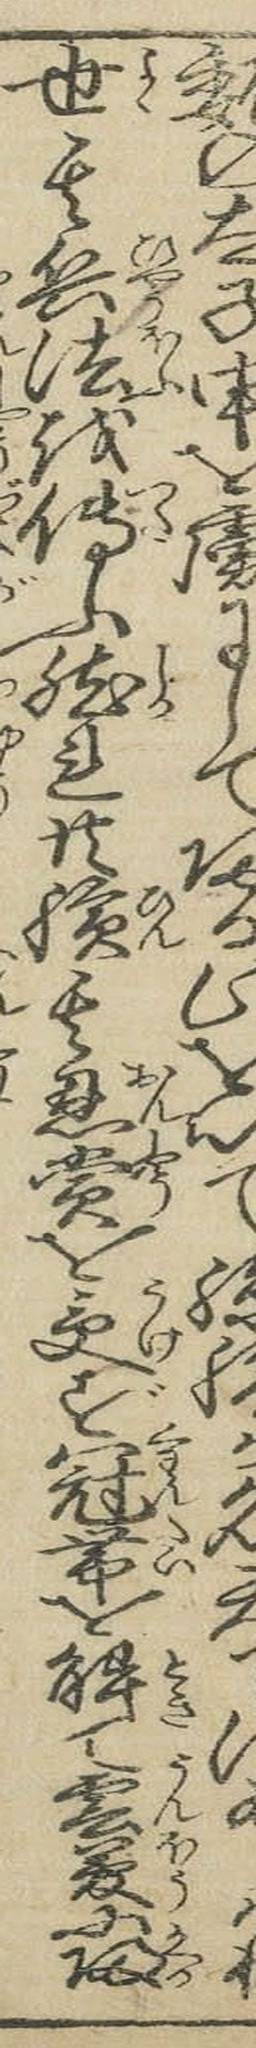世其兵法を伝ふ然れ共臏其恩賞を受ず冠帯を解て雲夢に帰
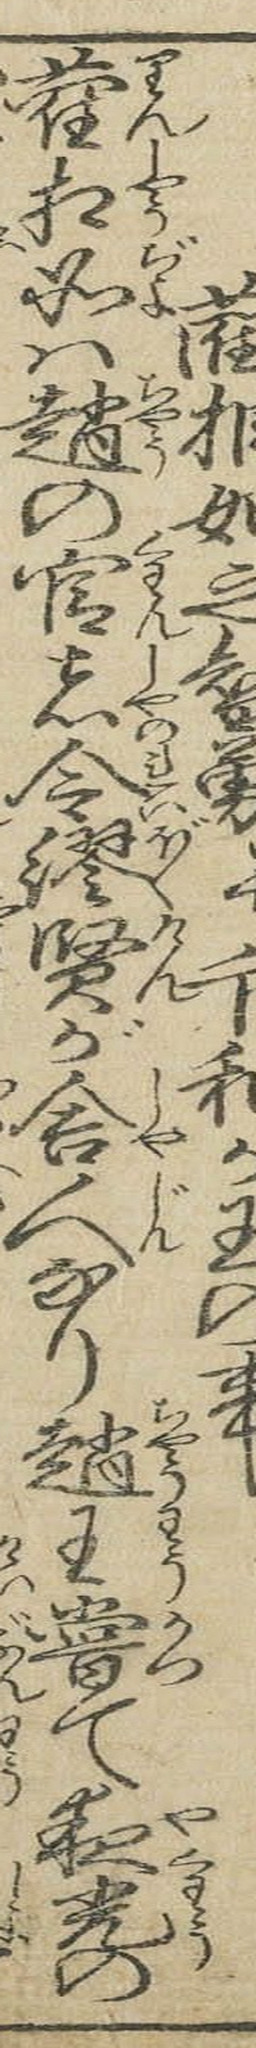藺相如は趙の官者令繆賢が舎人なり趙王嘗て夜光の
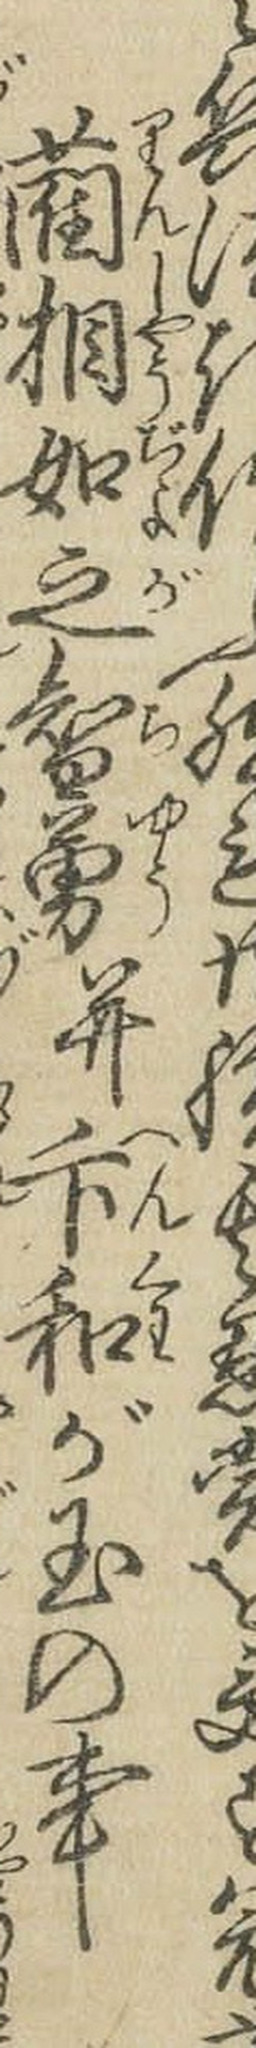藺相如之智勇并卞和が玉の事
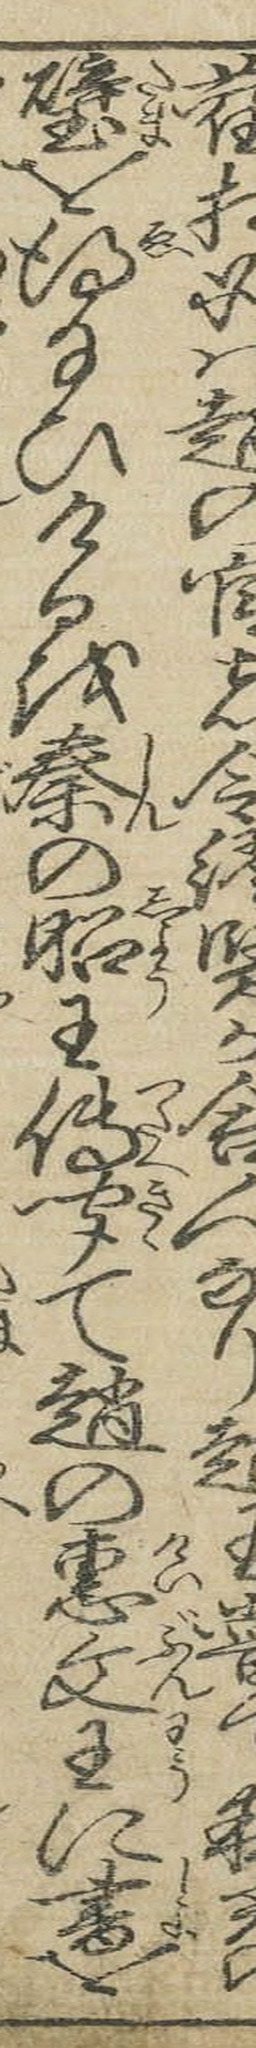璧を得給ひけるを秦の昭王伝聞て趙の恵文王に書を
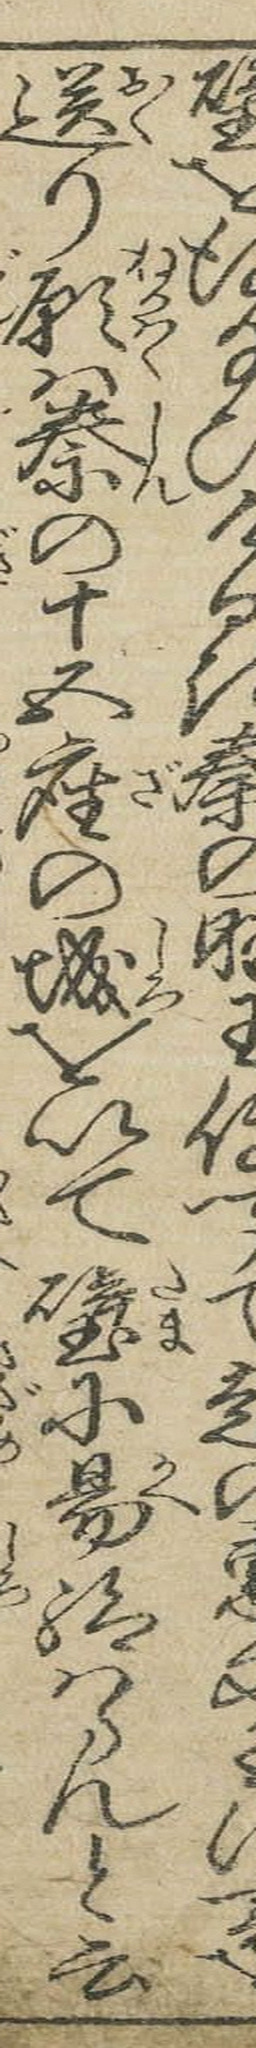送り願は秦の十五座の城を以て璧に易給はらんと云
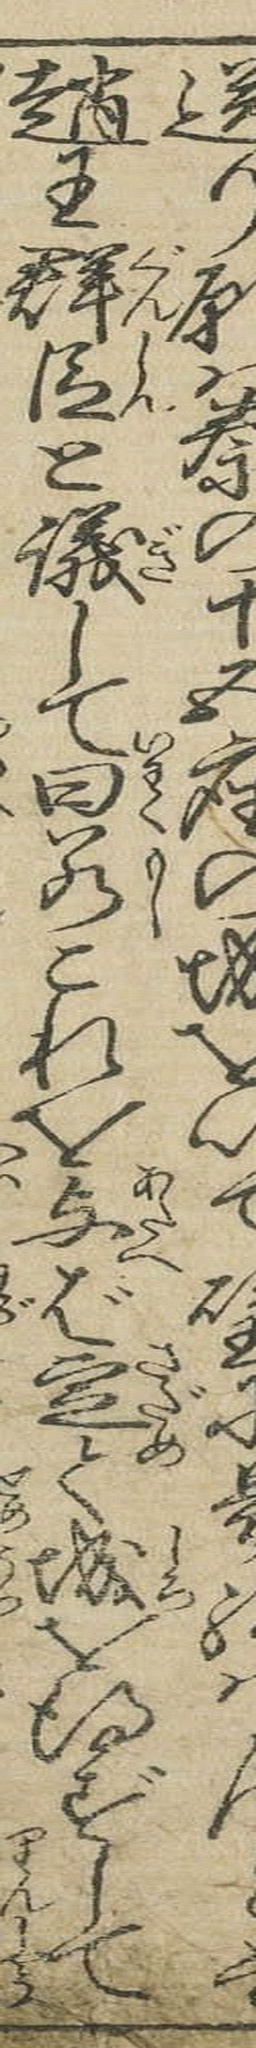趙王群臣と議して曰若これを与ば定て城を得ずして
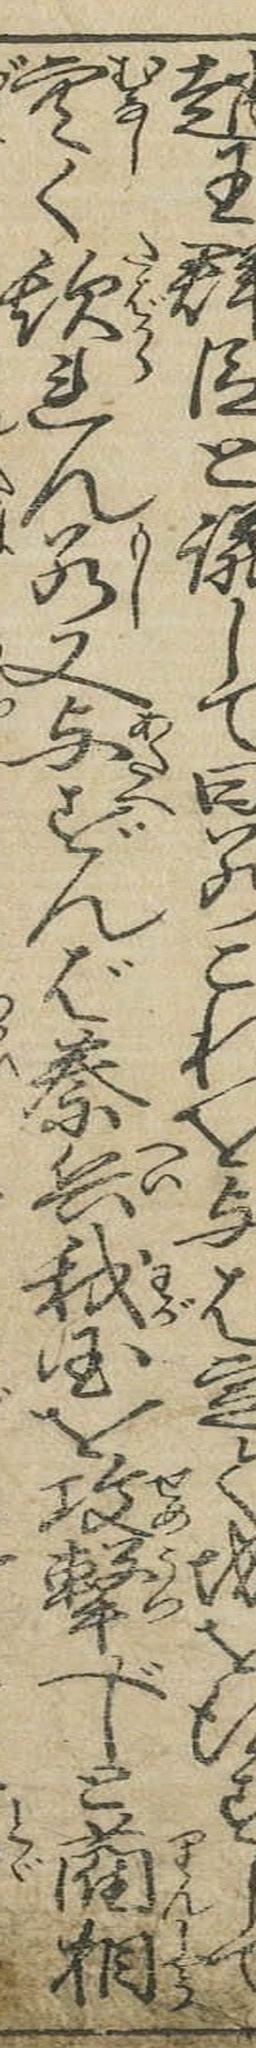空く欺れん若又与ずんば秦兵我国を攻撃べしと藺相
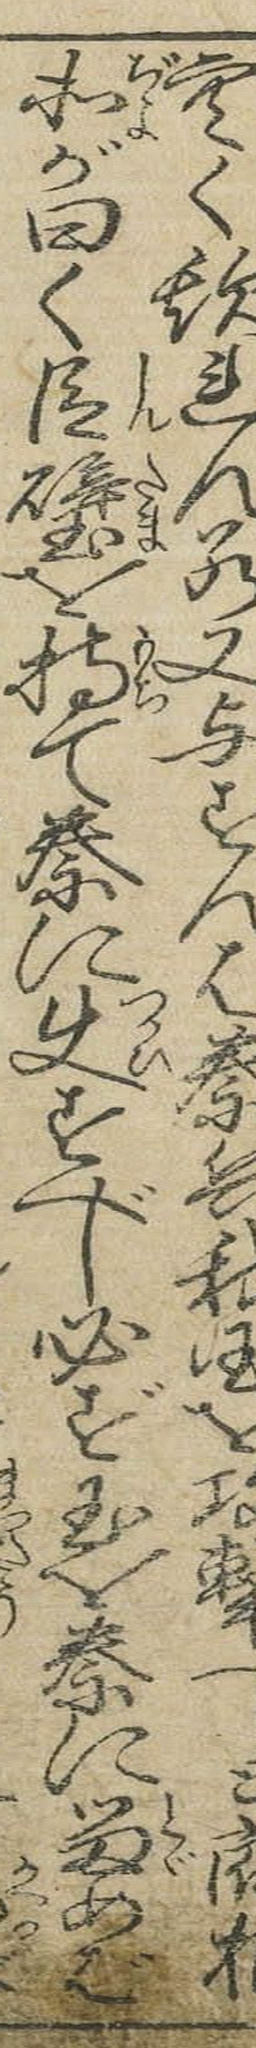如が曰く臣璧を持て秦に使すべし必ず玉を秦に留めば
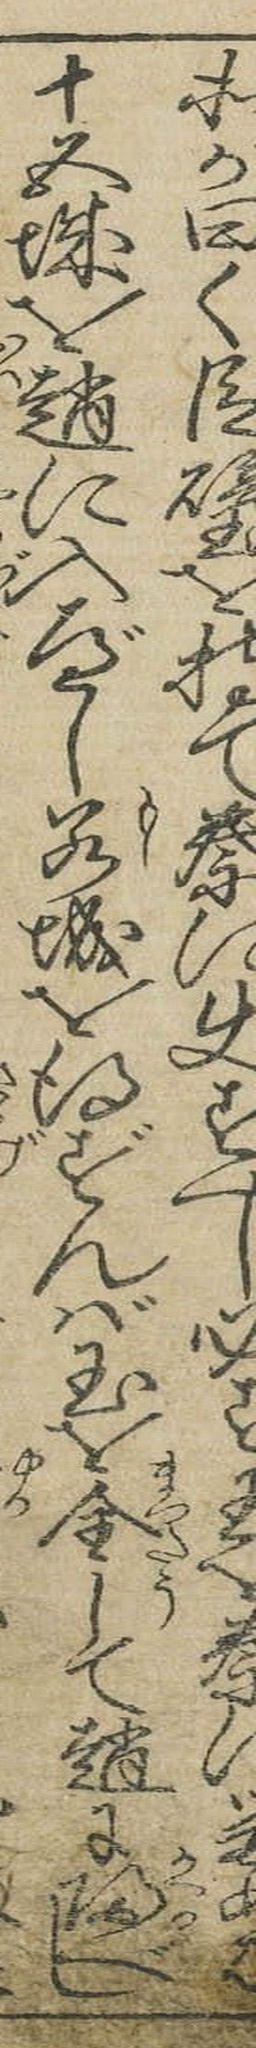十五城を趙に入べし若城を得ずんば玉を全して趙に帰べし
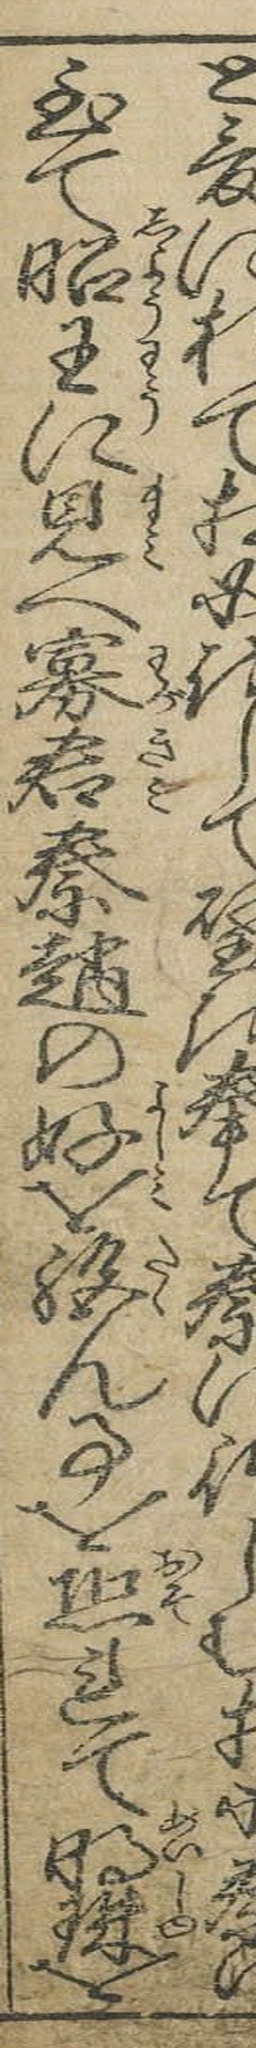至て昭王に見へ寡君秦趙の好を絶ん事を恐れて明珠を
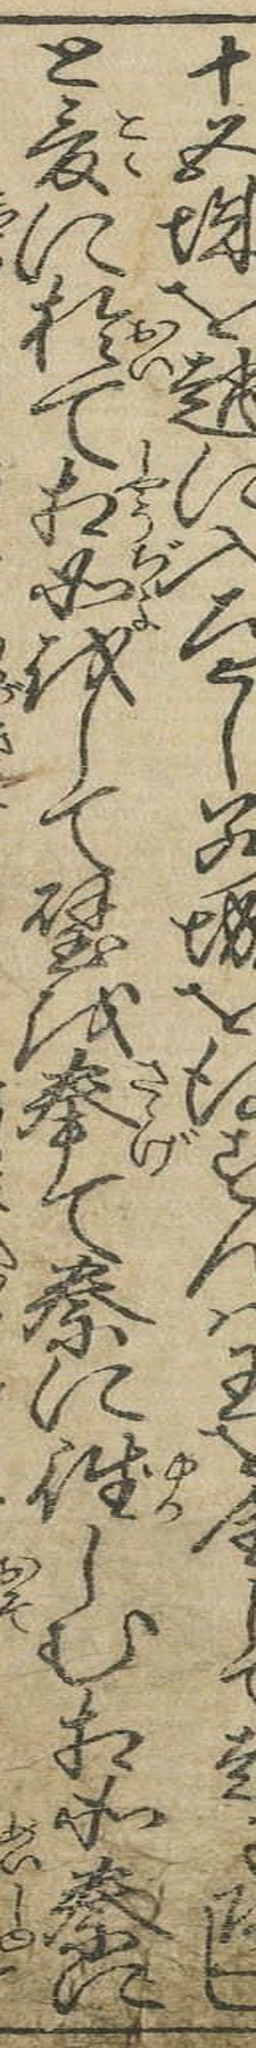と爰に於て相如をして璧を奉て秦に往しむ相如秦に

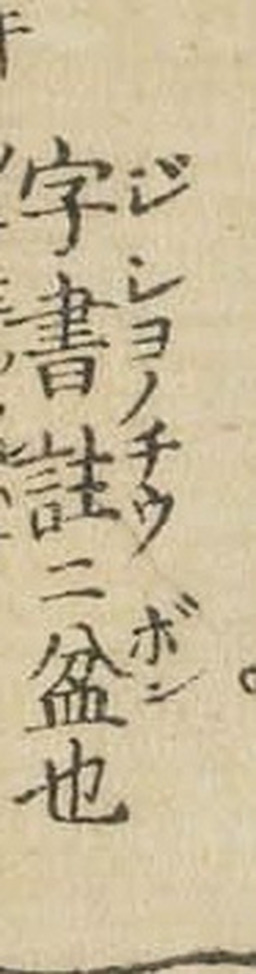字書註ニ盆也
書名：絵本写宝袋 9巻 6之巻
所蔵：東京学芸大学教育コンテンツアーカイブ
